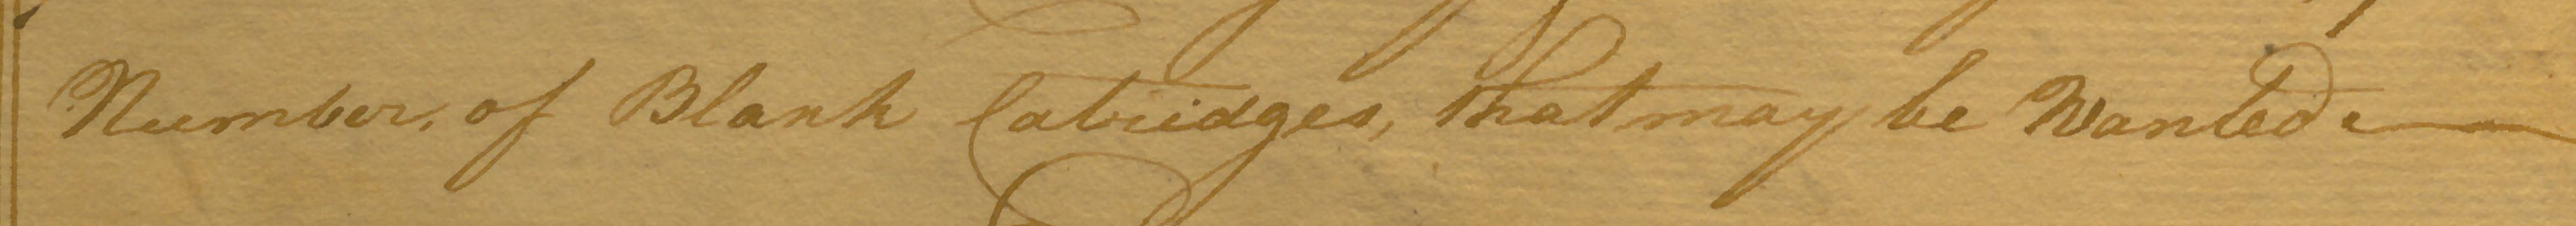Number of Blank Catridges, that may be Wanted-
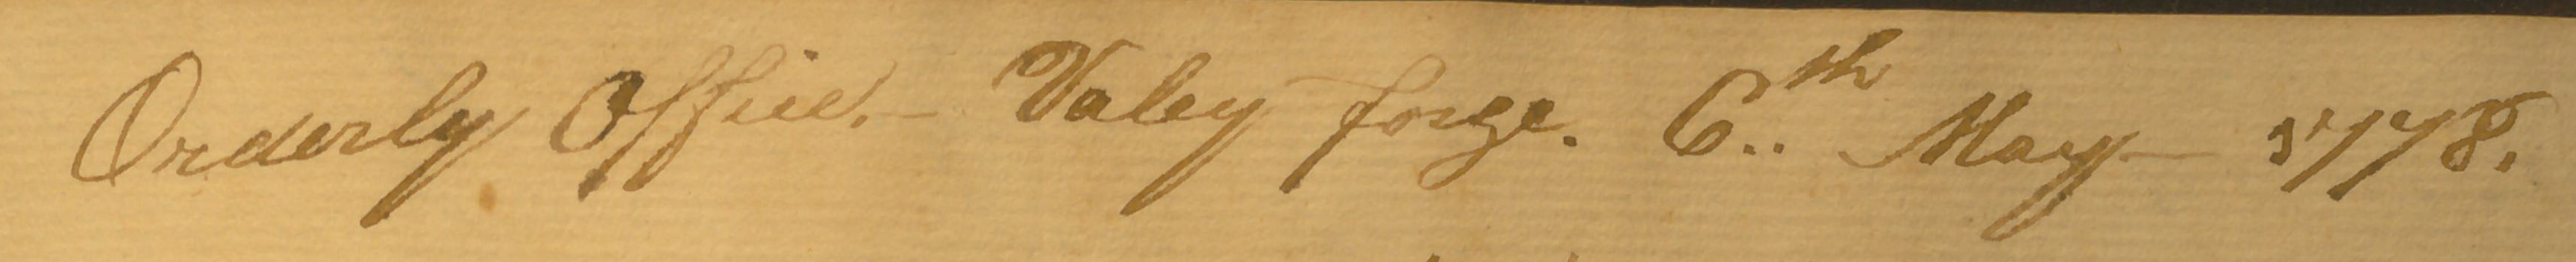Orderly Office. Valey forge. 6^th. May- 1778.
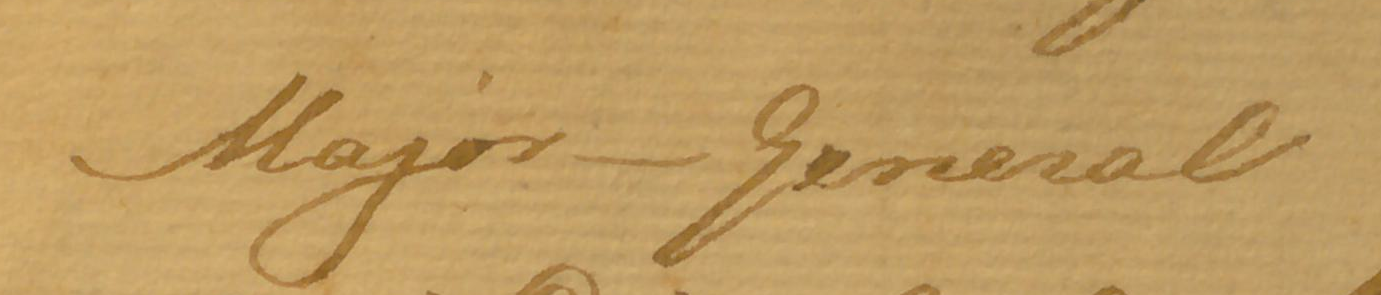Major- General
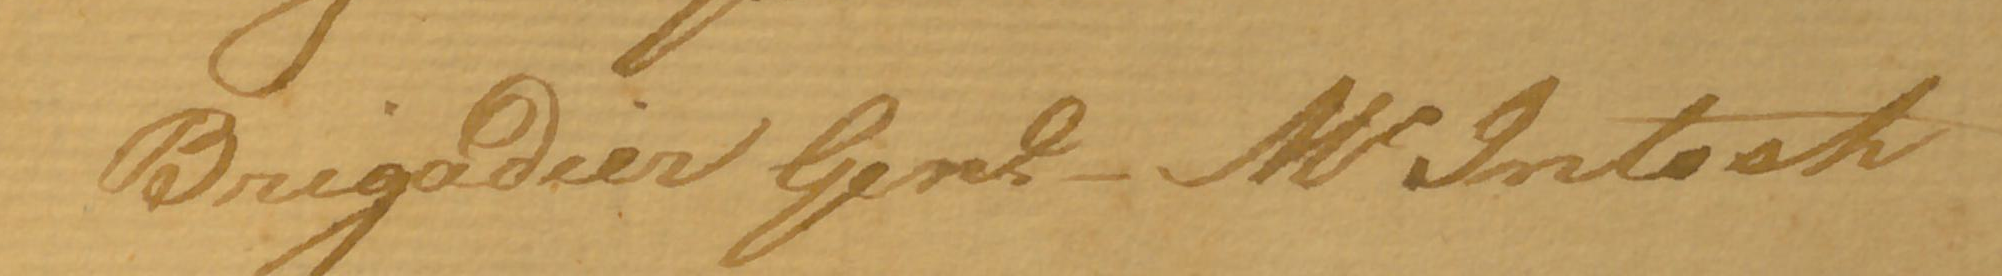Brigadier Gen^l. M^cIntosh
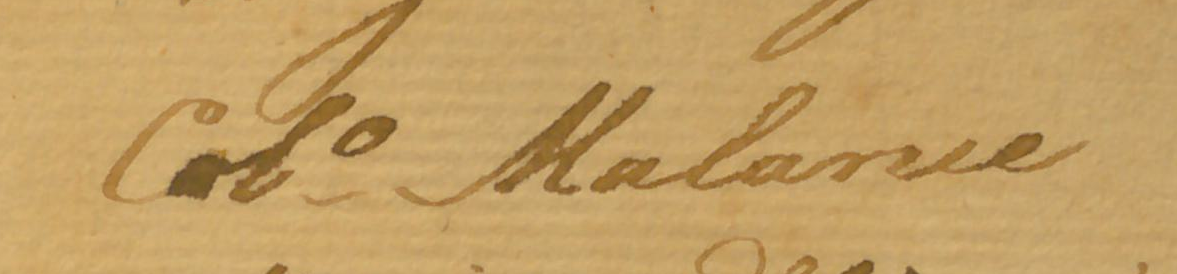Col^o. Malance
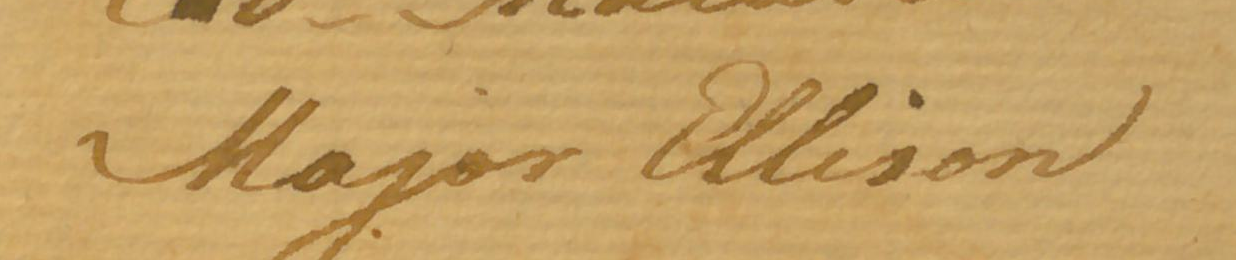Major Ellison
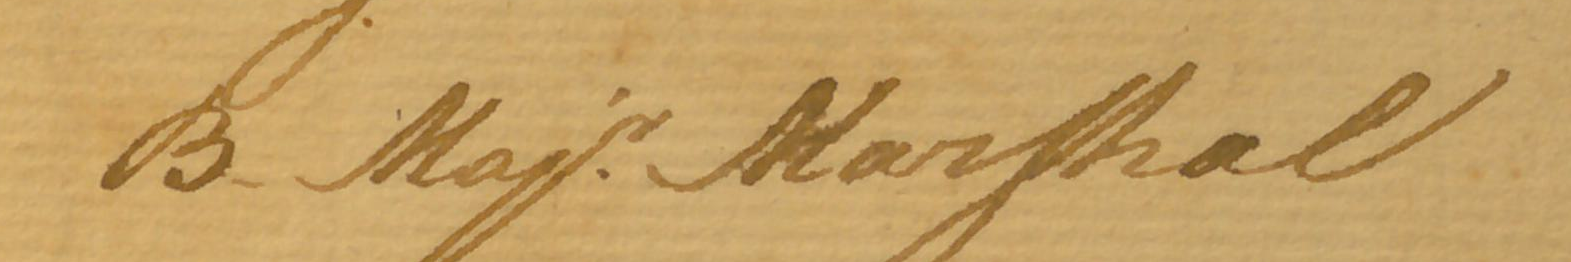B. Maj^r. Marshal
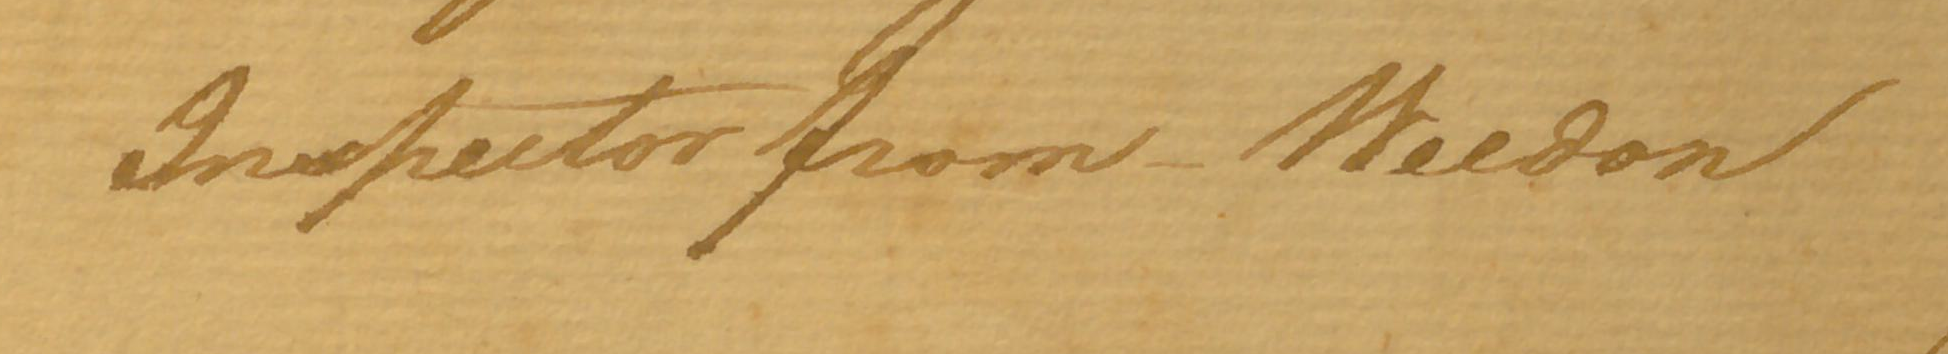Inspector from Weedon
